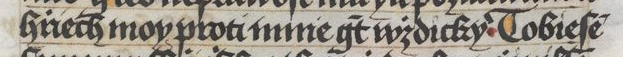hṙíech moy proti mnie ḡt wżdicky.Tobieſē
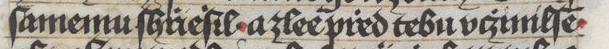ſamemu ſhṙieẛil.a zlee pṙed tebu vcżinílſe.
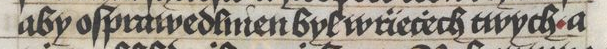aby oſprawedlnien byl wżieċech twych.a
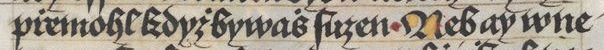pṙemohl když bywaṡ ſuzen.Neb ay wne¬
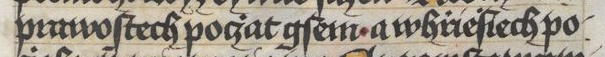prawoſtech pocżat gſem.a w hṙieẛiech po¬
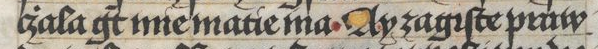cżala ḡt mie matie ma.Ay zagiſte praw¬
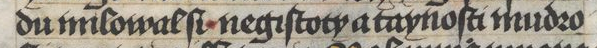du milowal ſi.negiſtoty a taynoſti mudro¬
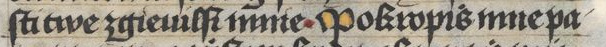ſti twe zgieuilſi mnie.Pokropiṡ mne pa¬
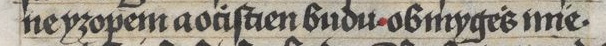ne yzopem a oċiſtien budu.obmygeṡ mie.
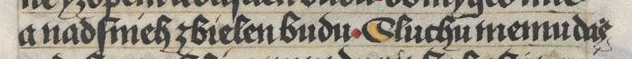a nadſníeh zbíelen budu.Sluchu memu daṡ
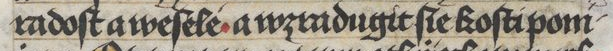radoſt a weſelé.a wzradugit ſie koſti poní¬
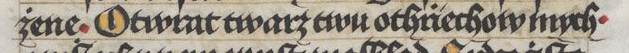żene.Otwrat twarz twu othṙíechow mych.
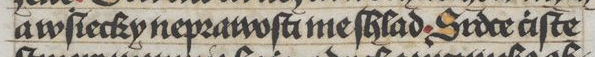a wẛiecky neprawoſti me ſhlad.Srdce ċiſte
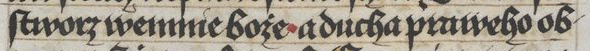ſtworz wemnie boże.a ducha praweho ob¬
